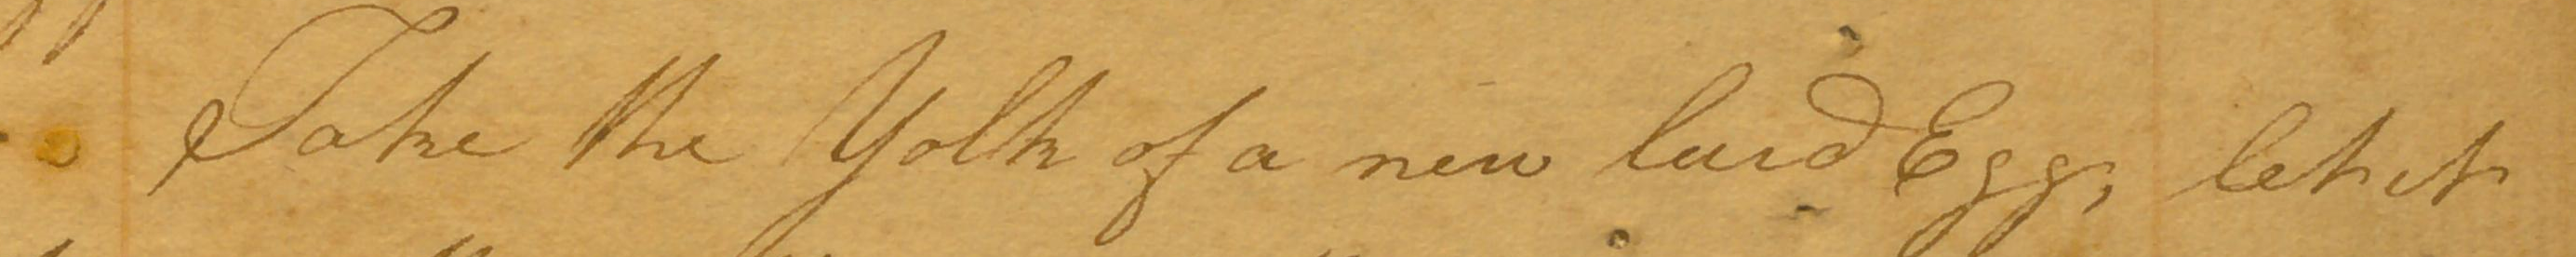Take the Yolk of a new laid Egg, let it
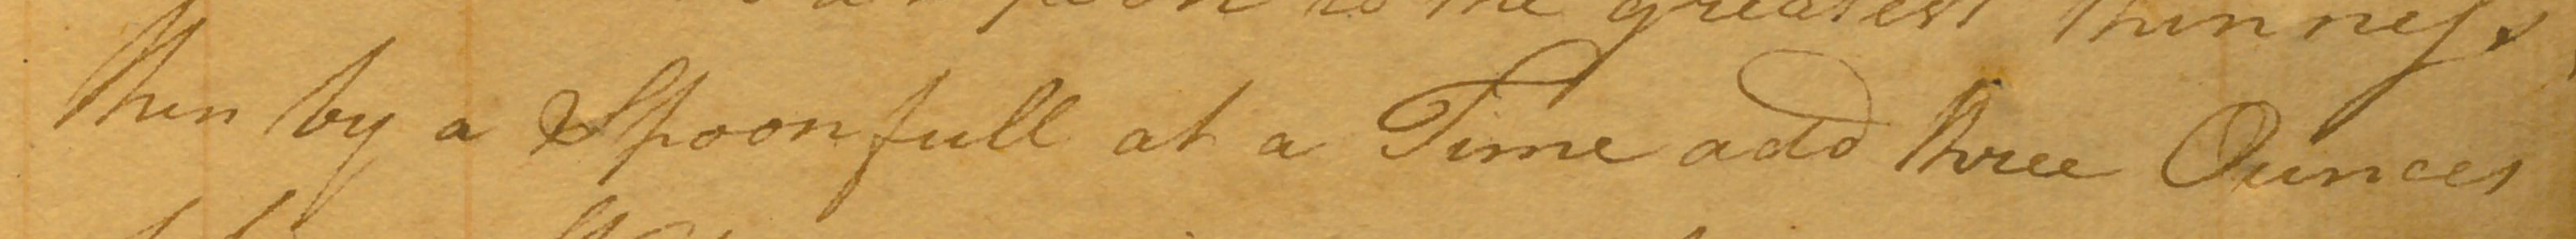then by a Spoonfull at a Time add three Ounces
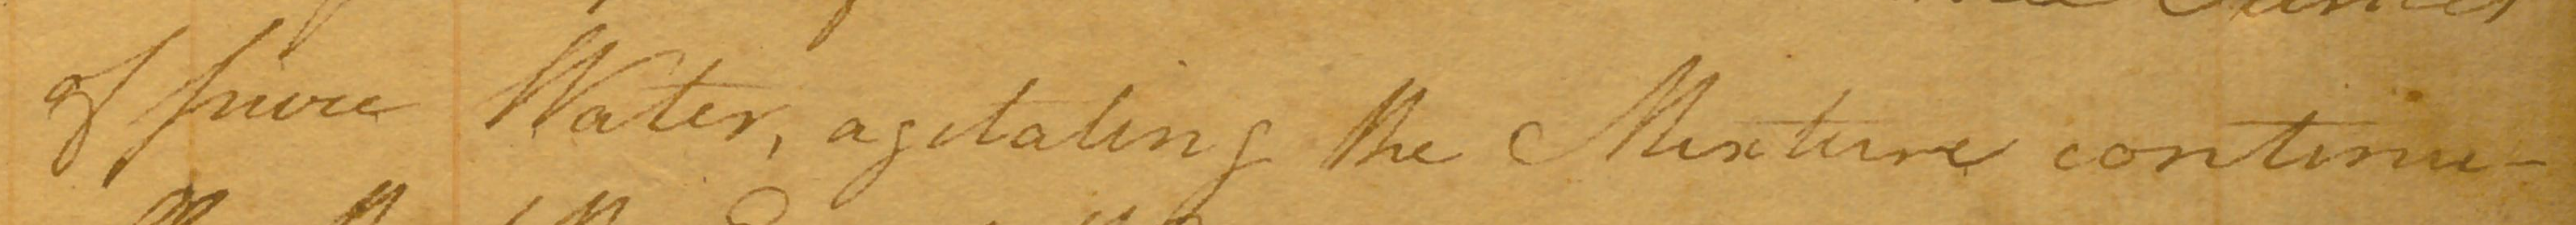of pure Water, agitating the Mixture continu-
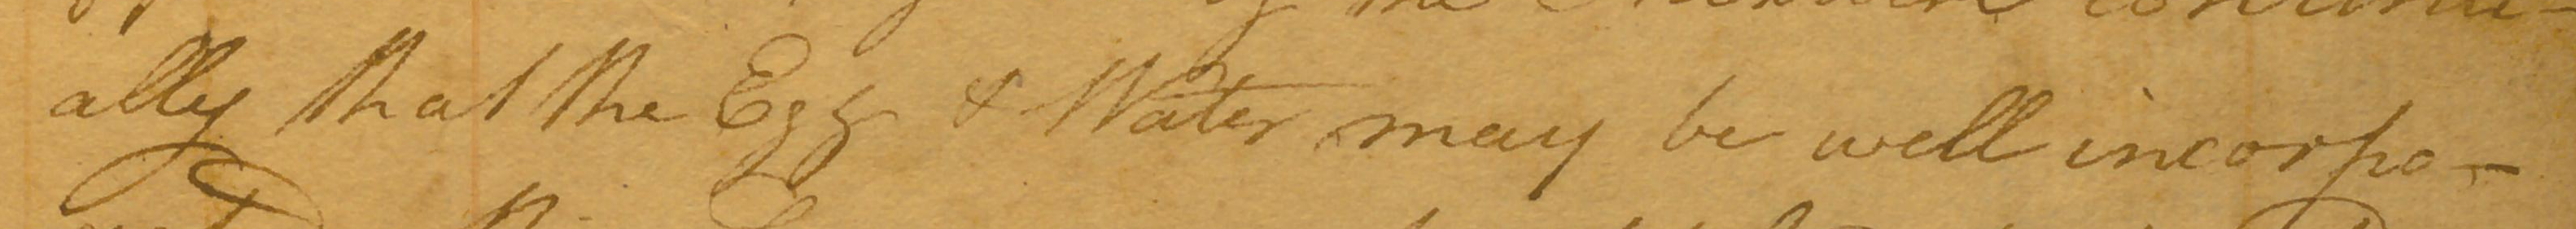ally that the Egg & Water may be well incorpo-
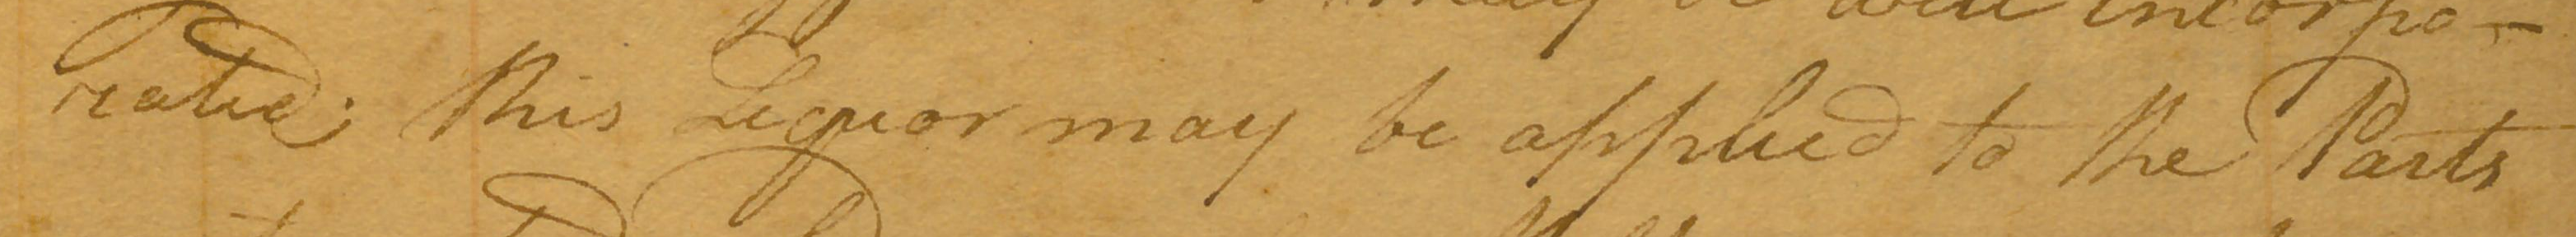rated; this Liquor may be applied to the Parts
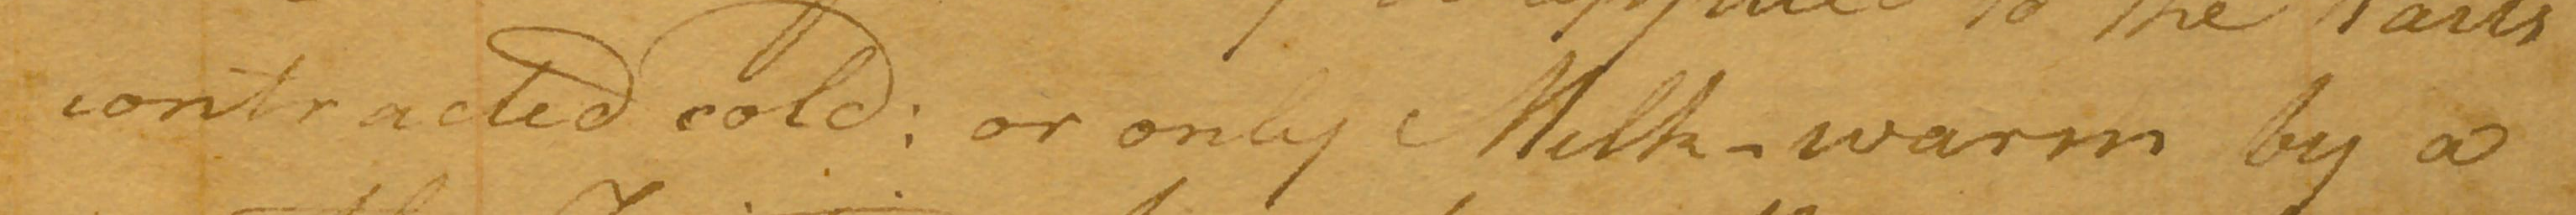contracted cold; or only Milk-warm by a
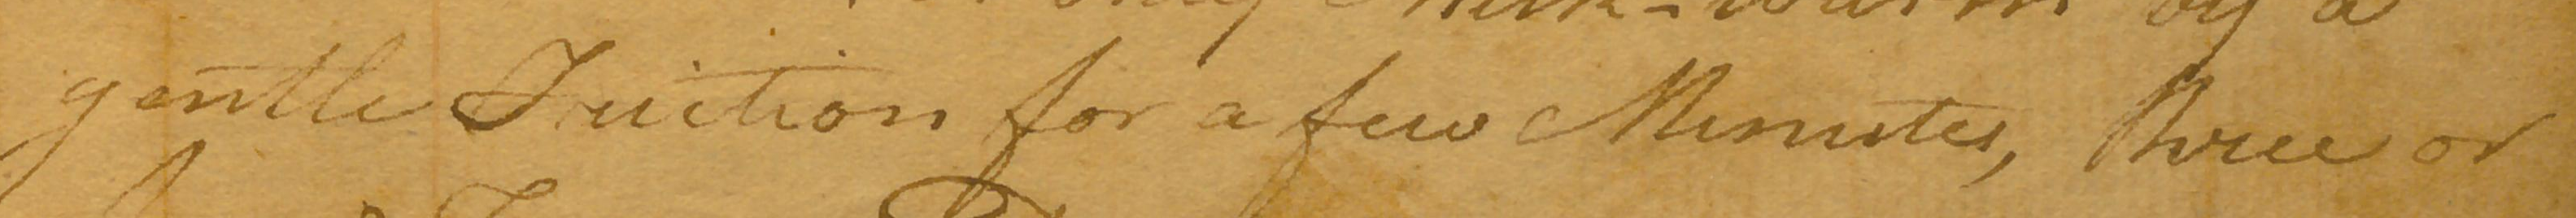gentle Friction for a few Minutes, three or
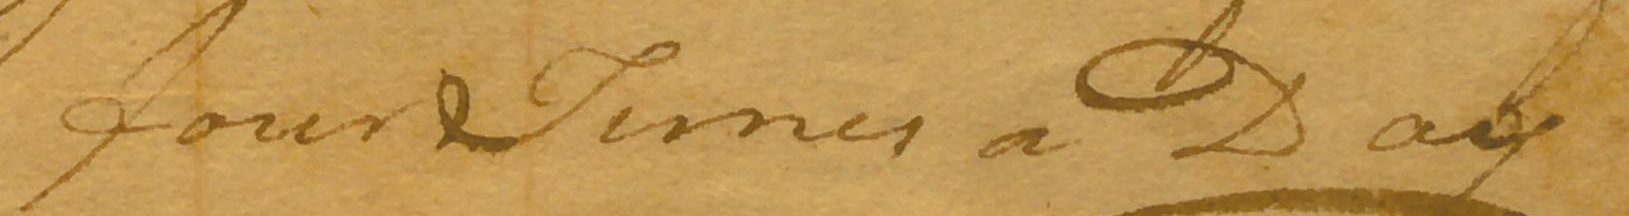four Times a Day
